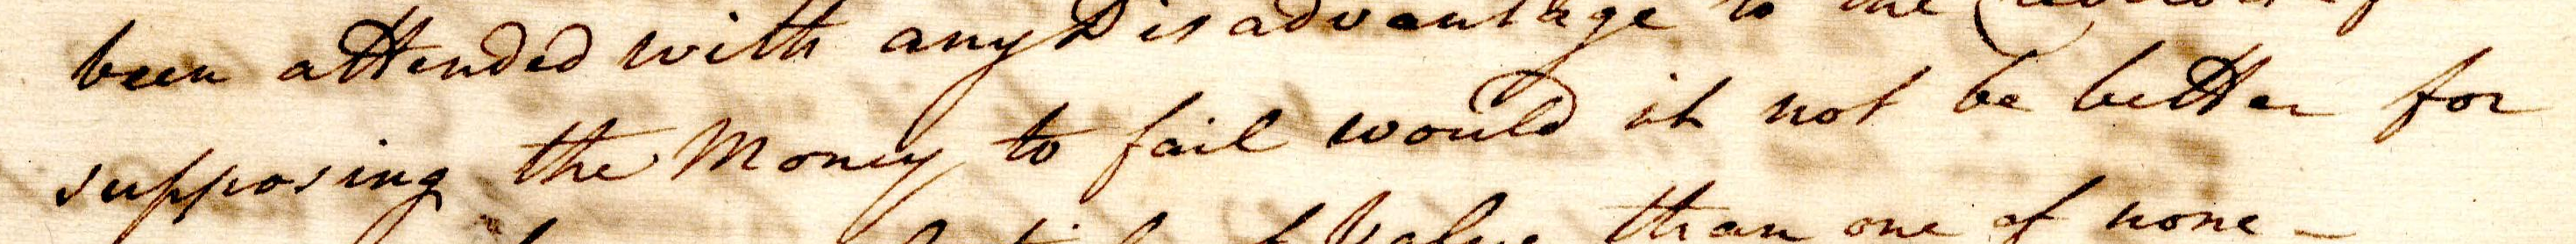supposing the Money to fail would it not be better for
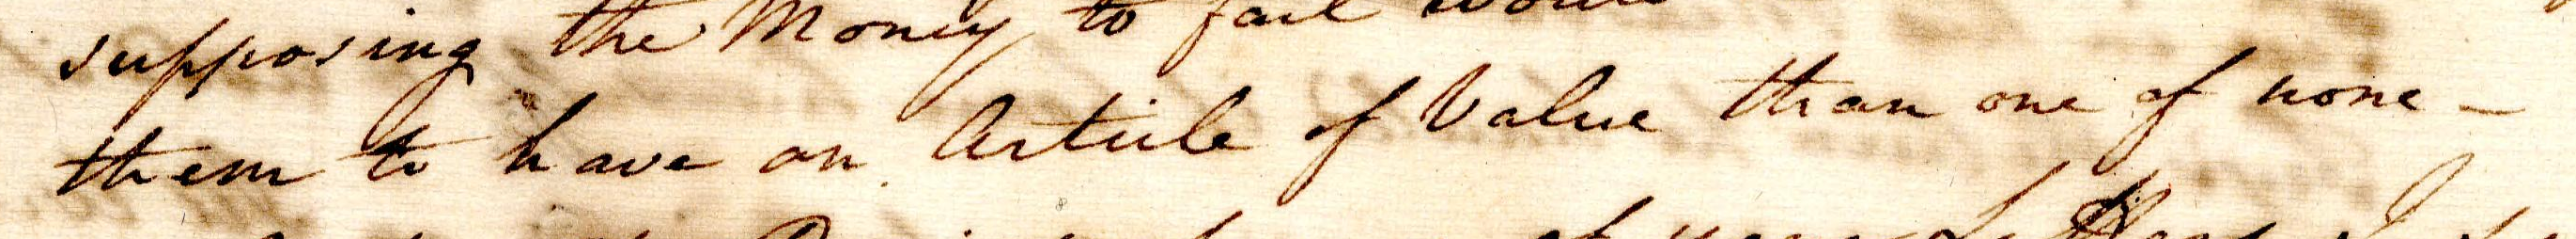them to have an Article of Value than one of none-
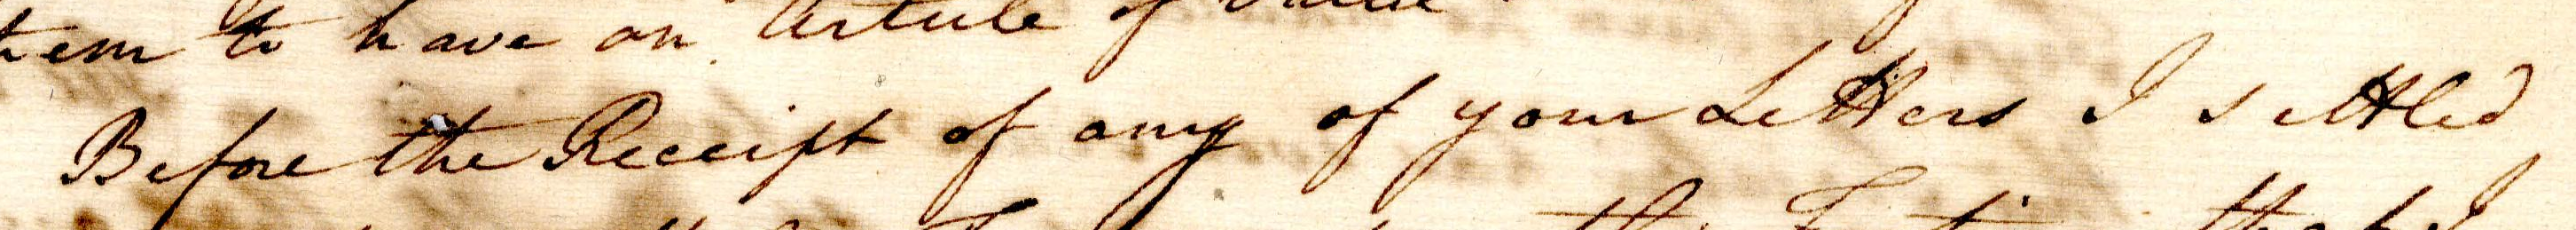Before the Receipt of any of your Letters I settled
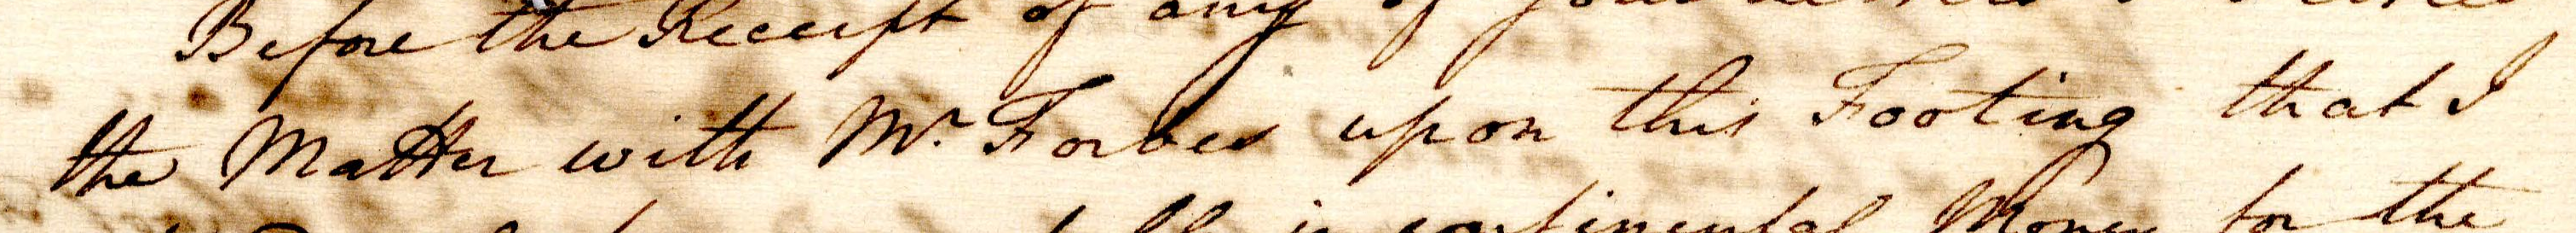the Matter with M^r. Forbes upon this Footing that I
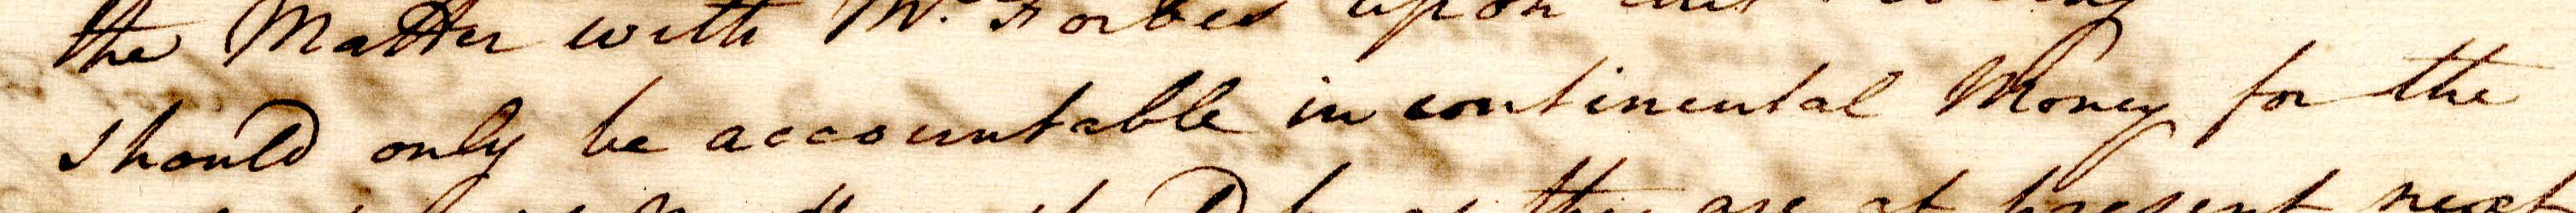should only be accountable in continental Money for the
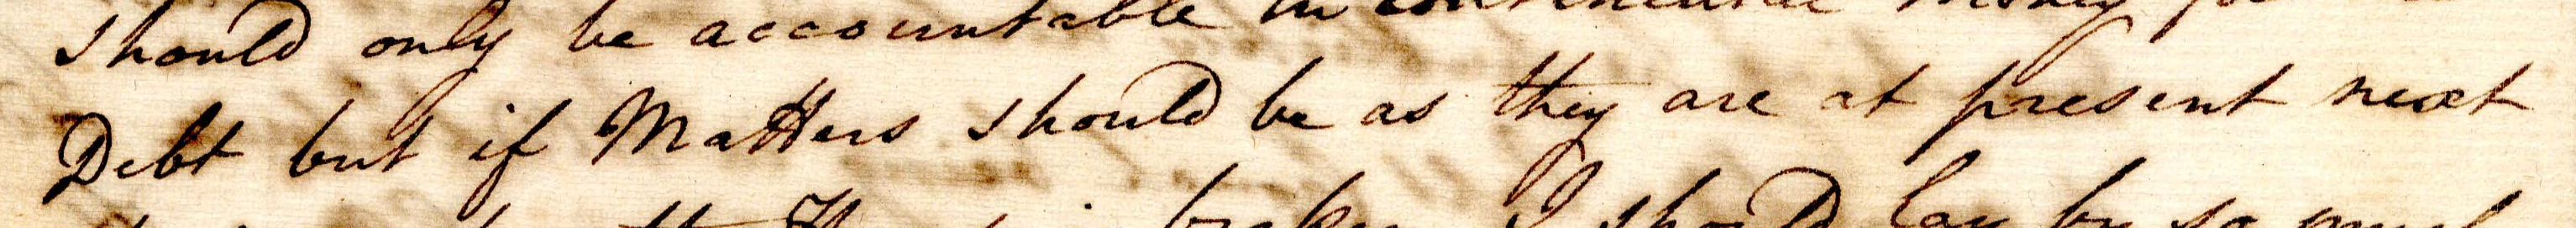Debt but if Matters should be as they are at present next
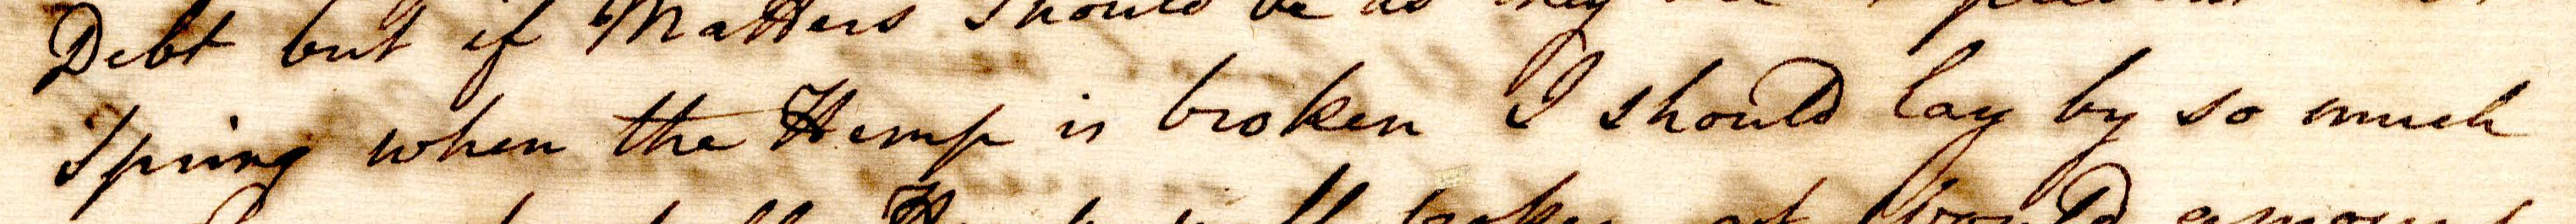spring when the Hemp is broken I should lay by so much
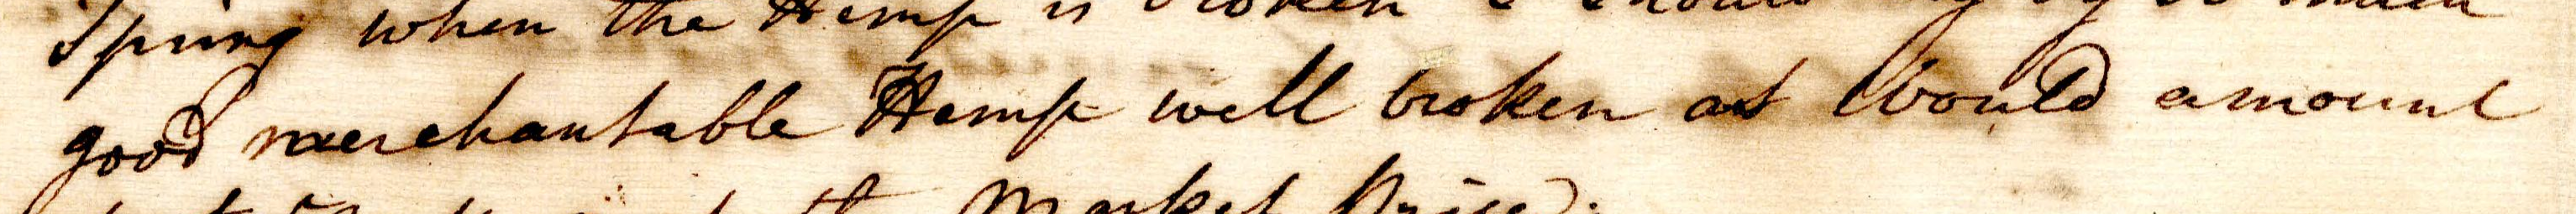good merchantable Hemp well broken as would amount
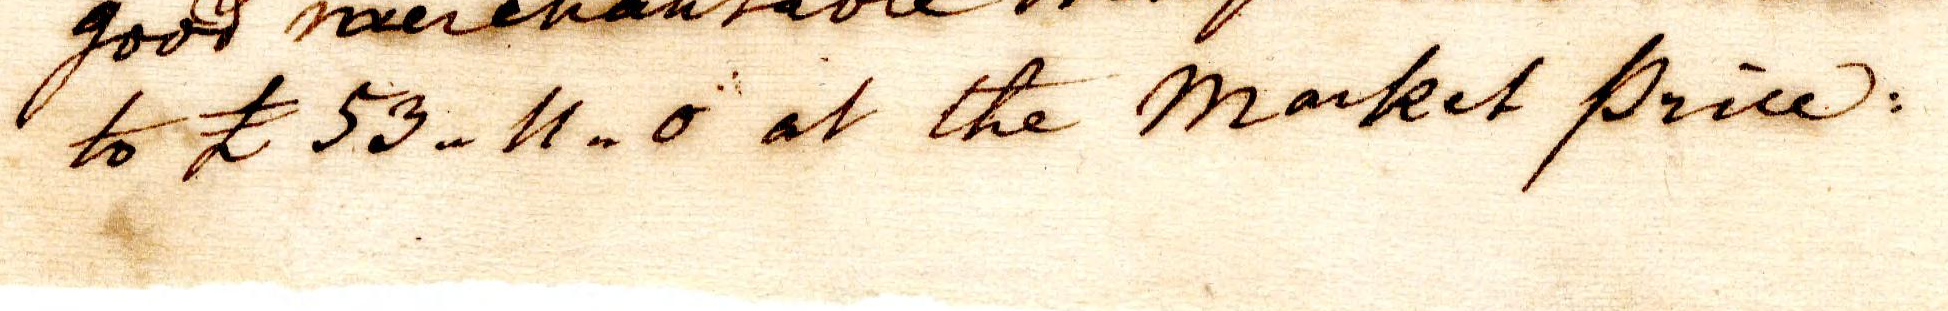to £53.11.0 at the Market Price:
